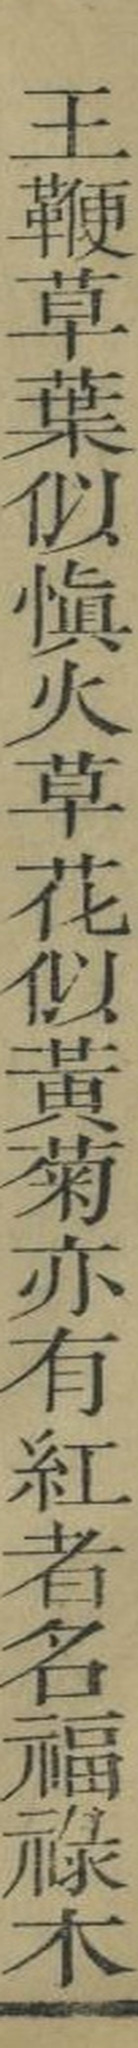王鞭草葉似慎火草花似黄菊亦有紅者名福禄木
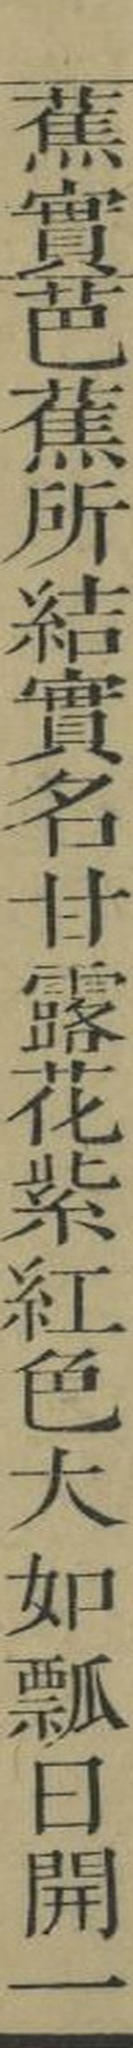[蕉実]芭蕉所結実名甘露花紫紅色大如瓢日開一
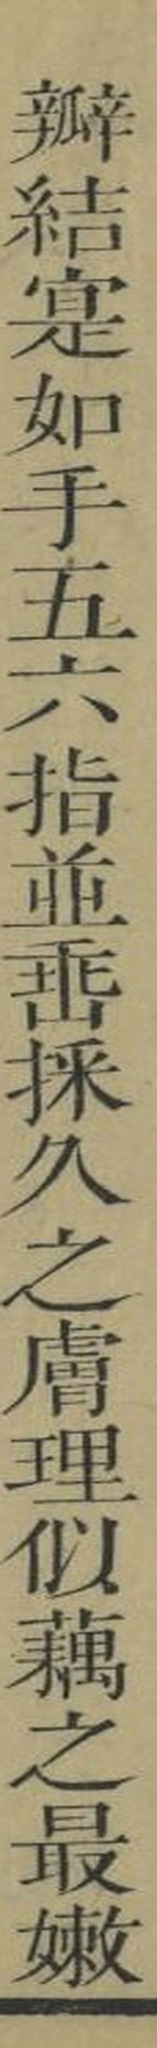弁結寔如手五六指並垂採久之膚理似藕之最嫩
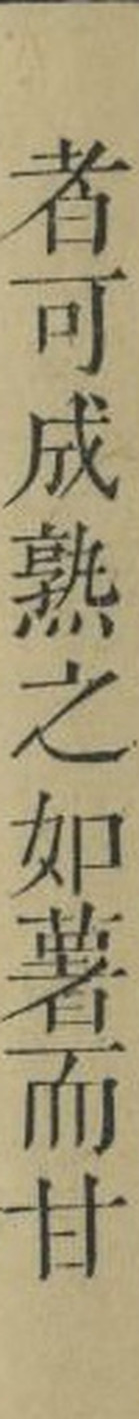者可成熟之如薯而甘
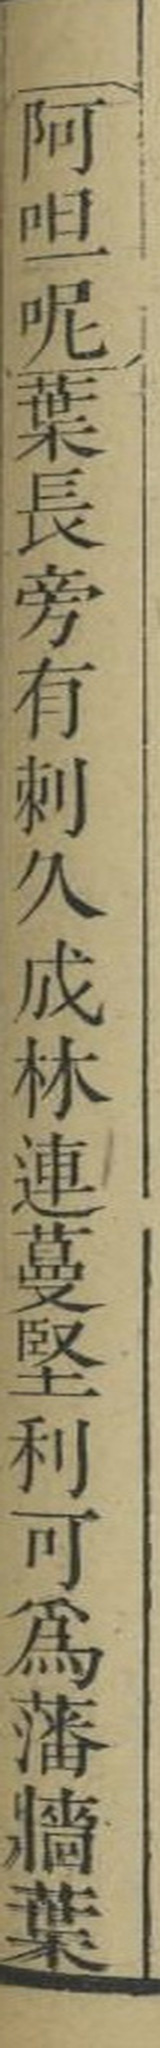[阿呾呢]葉長旁有刺久成林連蔓堅利可為藩牆葉
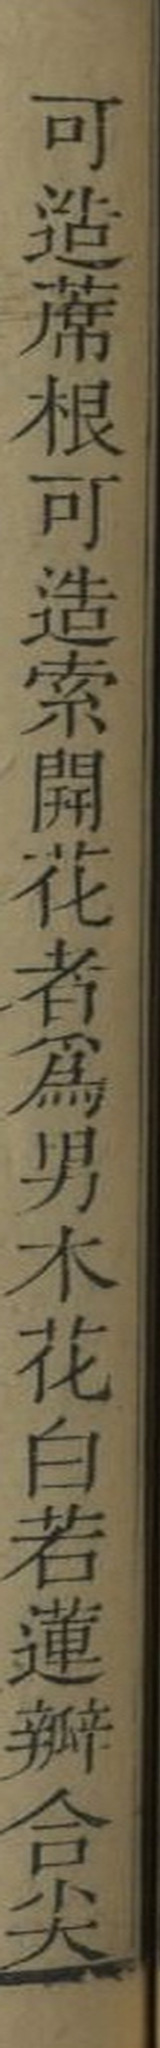可造蓆根可造索開花者為男木花白若蓮弁合尖
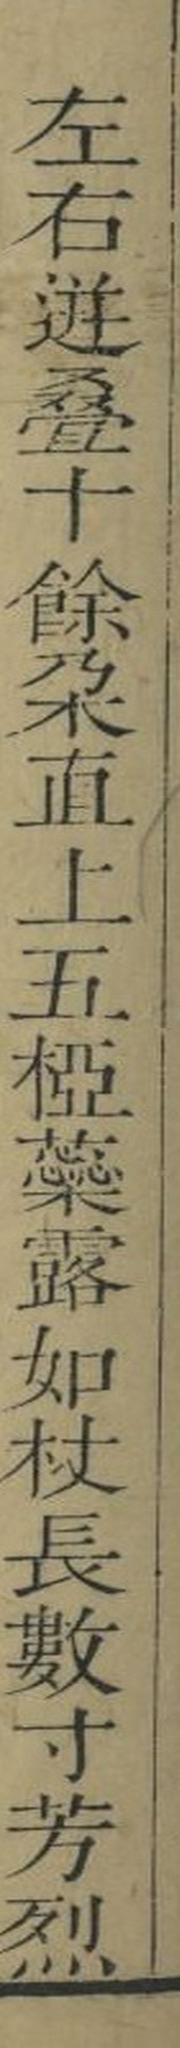左右迸叠十与朶直上五椏蘂露如杖長数寸芳烈
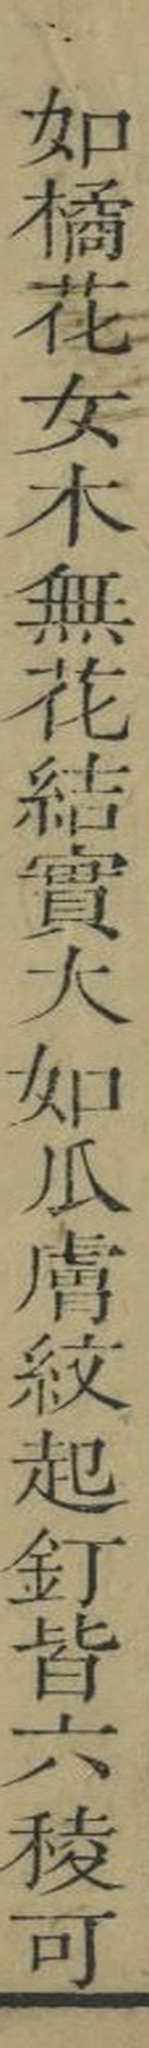如橘花女木無花結実大如瓜膚紋起釘皆六稜可
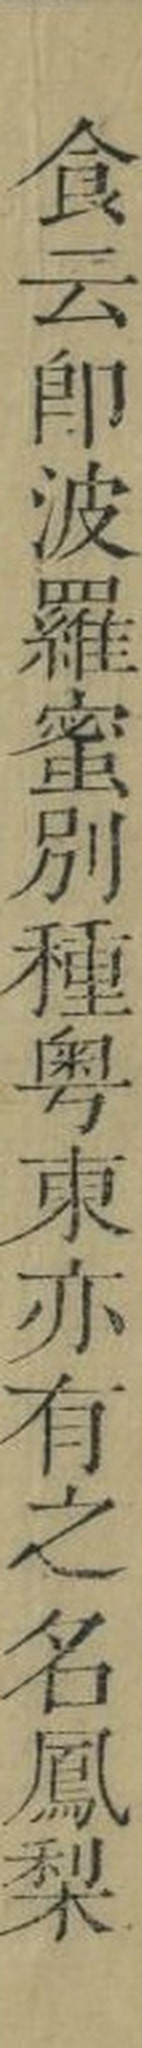食云即波羅蜜別種粤東亦有之名鳳梨
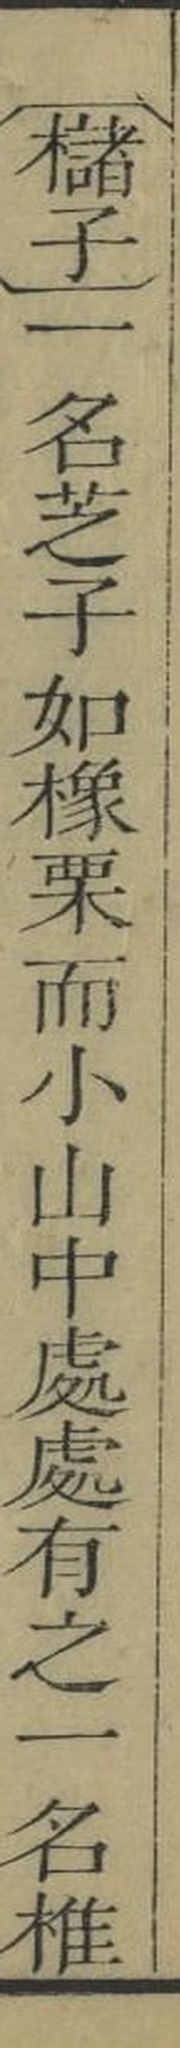[櫧子]一名芝子如橡栗而小山中処処有之一名椎
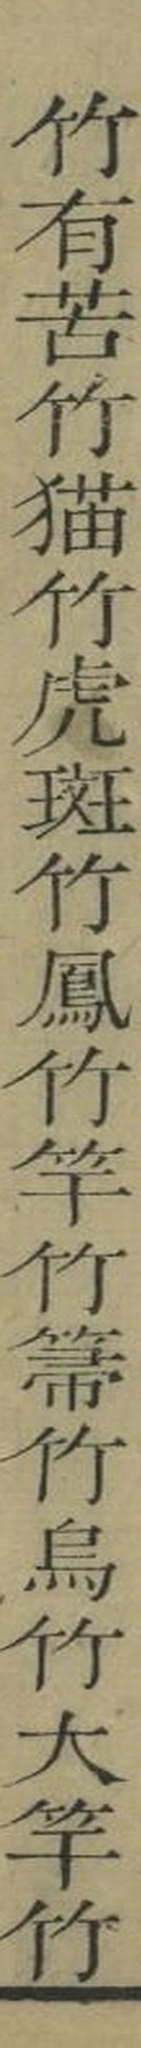竹有苦竹猫竹虎斑竹鳳竹竿竹箒竹烏竹大竿竹
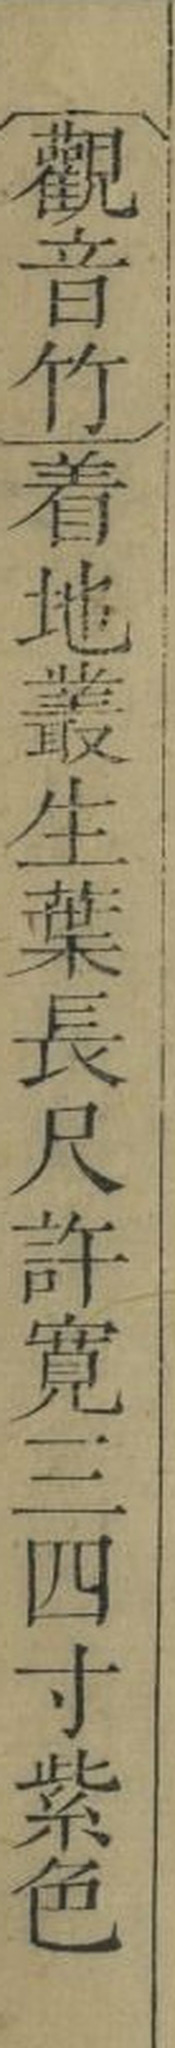[観音竹]着地叢生葉長尺許寛三四寸紫色

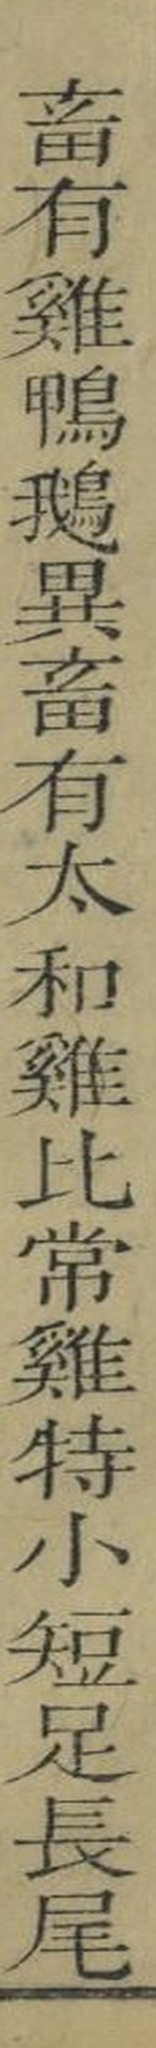畜有鶏鴨鵝異畜有太和鶏比常鶏特小短足長尾
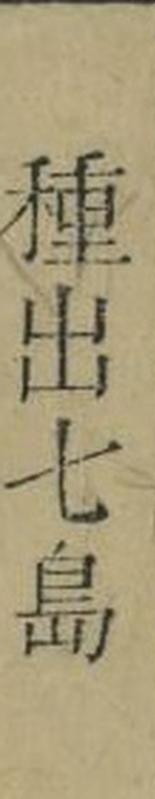種出七島
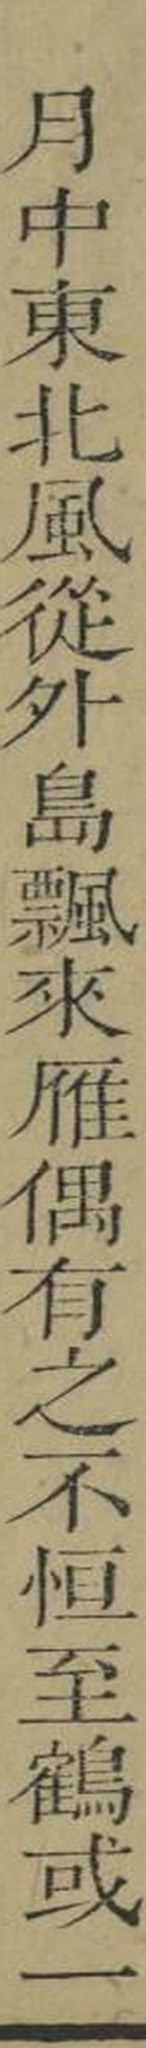月中東北風従外島飄来雁偶有之不恒至鶴或一
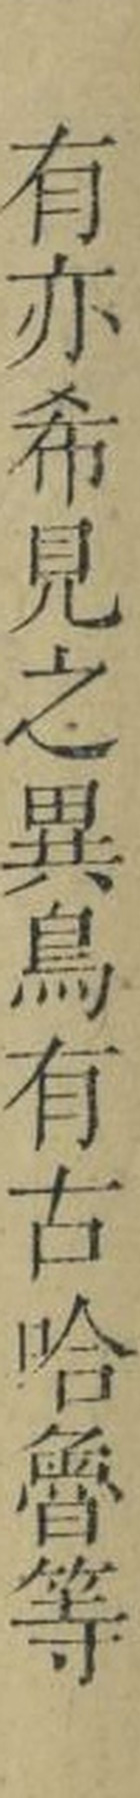有亦希見之異鳥有古哈魯等
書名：中山伝信録 巻六
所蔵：University of the Ryukyus Library
